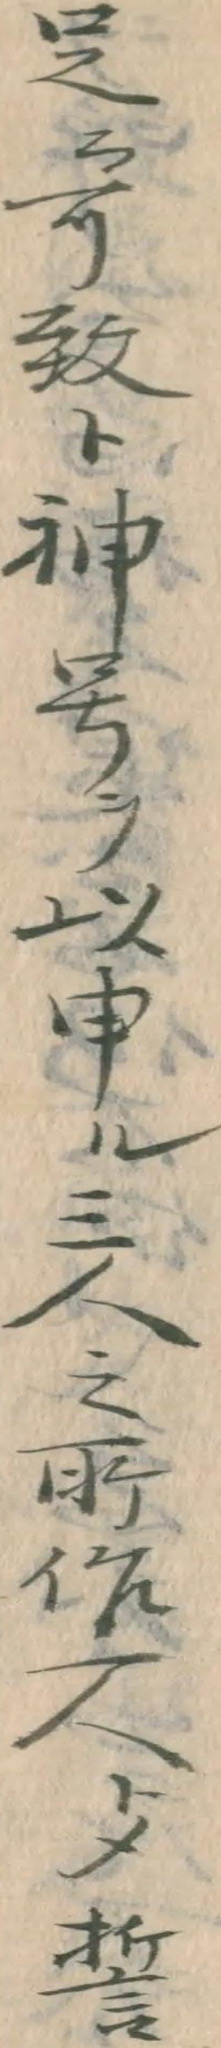足而可致ト神号ヲ以申ル三人之所作一人トシテ誓
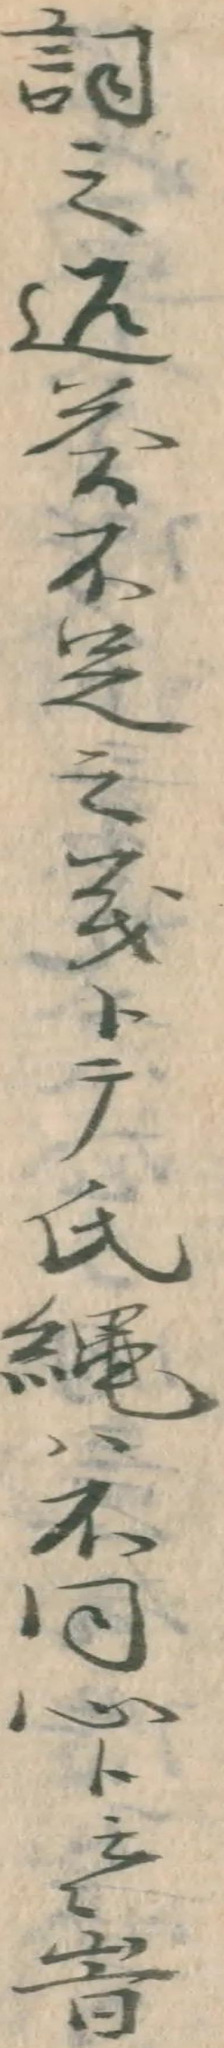詞之返答不足之義トテ氏縄ハ不同心ト云々旹
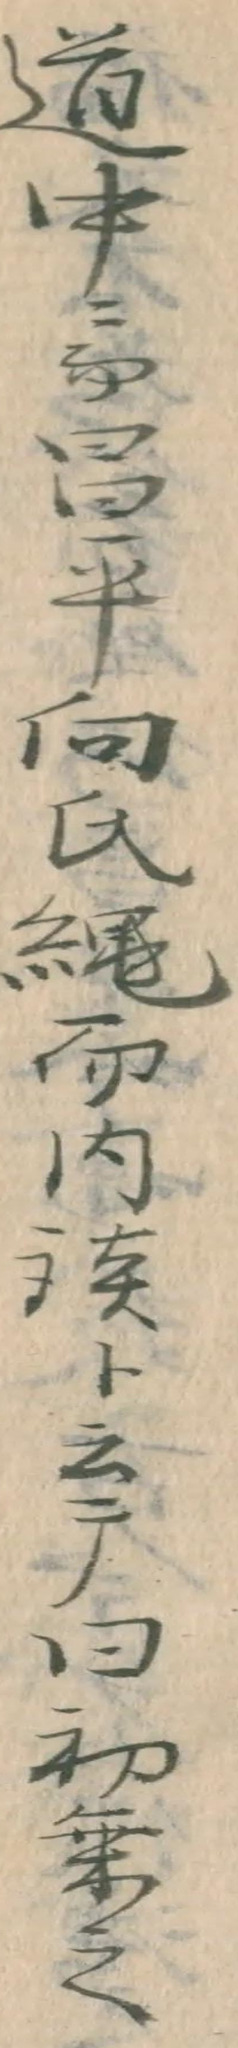道中ニ而昌平向氏縄而内談ト云テ曰初乗之
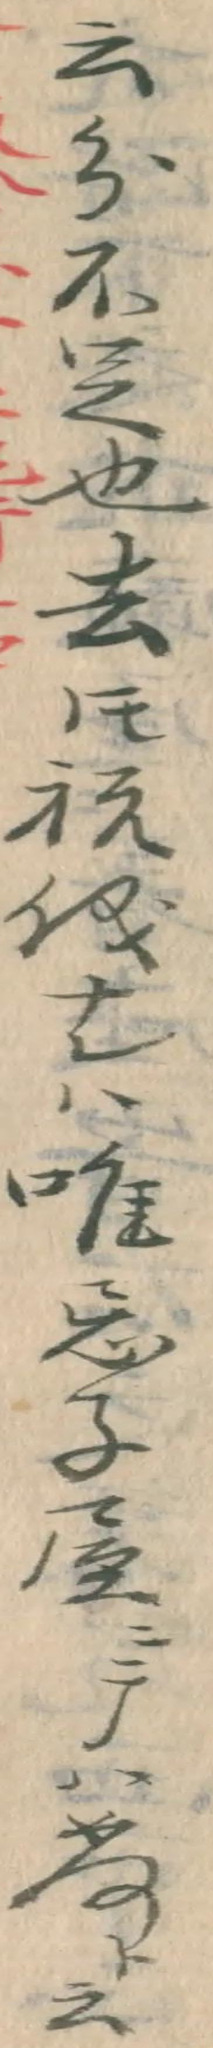云分不足也去トモ祝儀ナレハ唯忌子屋ニテハ如何ト云
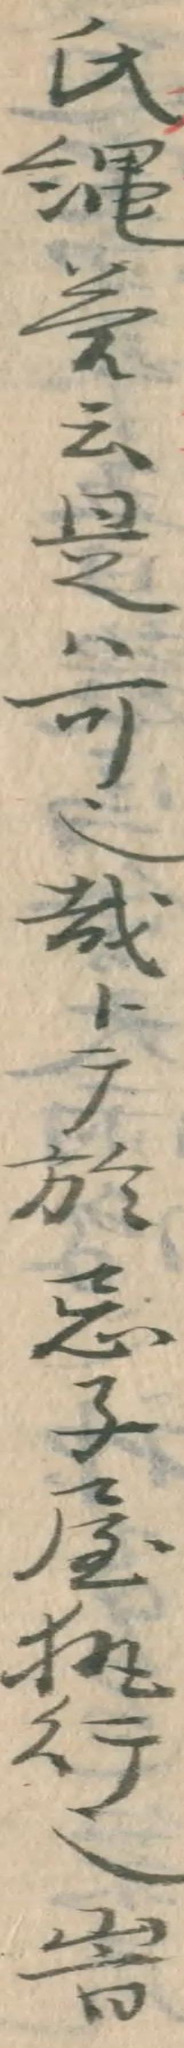氏縄答云是ハ可也哉トテ於忌子屋執行也旹
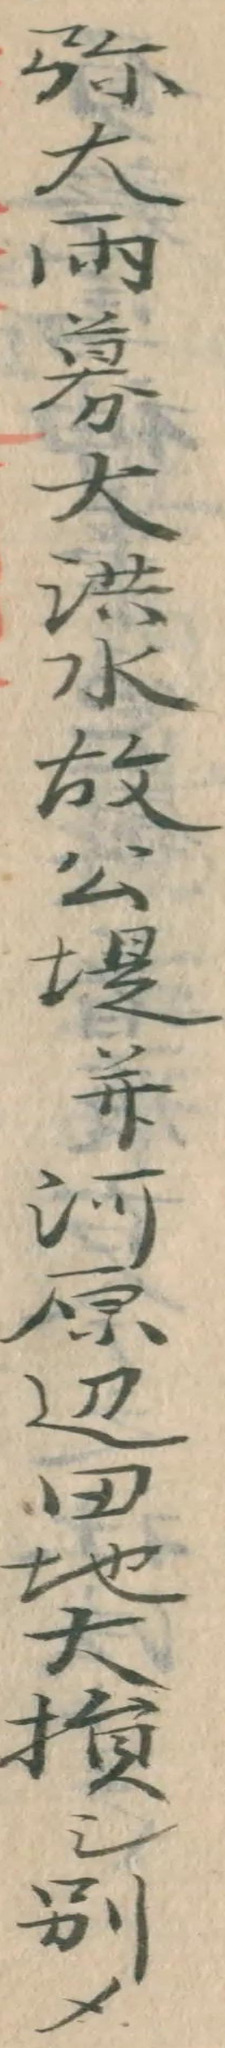弥大雨募大洪水故公堤并河原辺田地大損シ別シテ
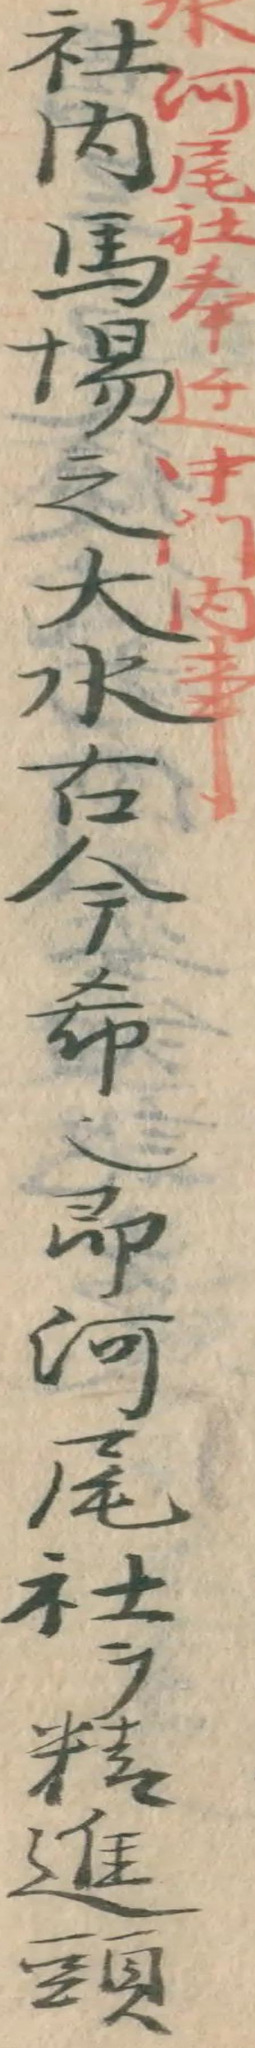社内馬場之大水古今希也即河尾社ヲ精進頭
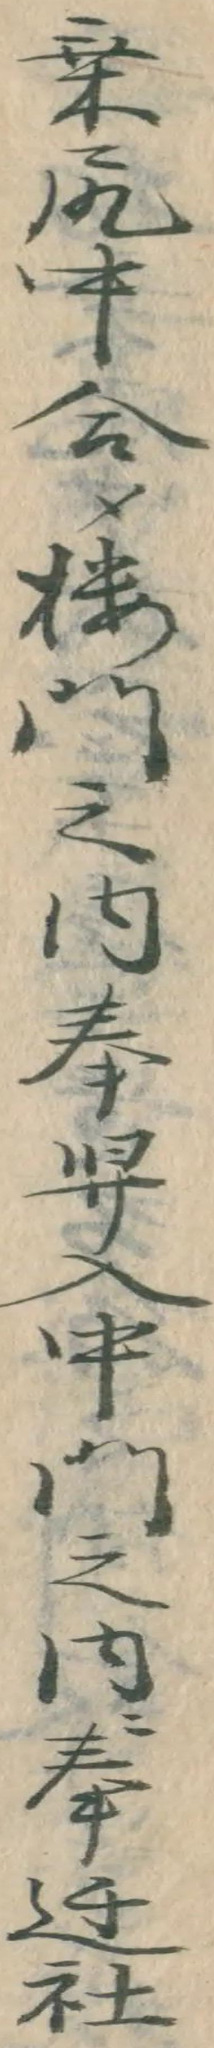乗尻中合シテ桜門之内奉舁入中門之内ニ奉迂社

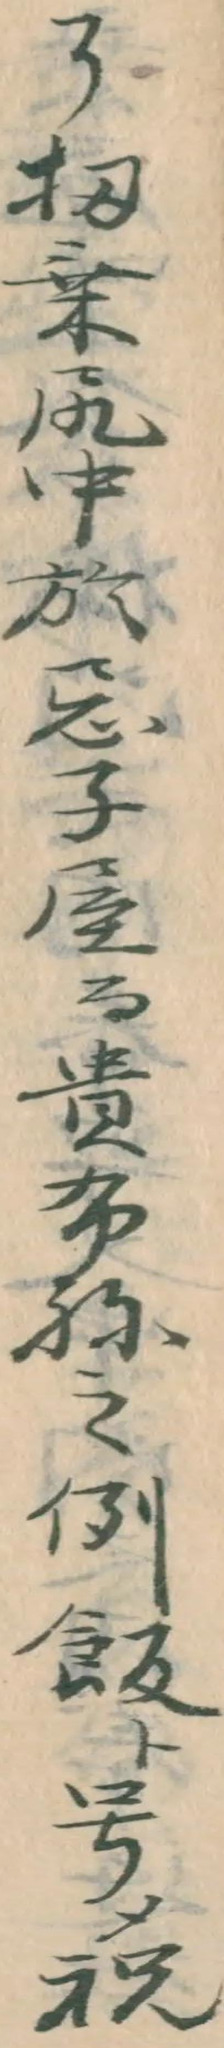了扨乗尻中於忌子屋而貴布称之例飯ト号シテ祝
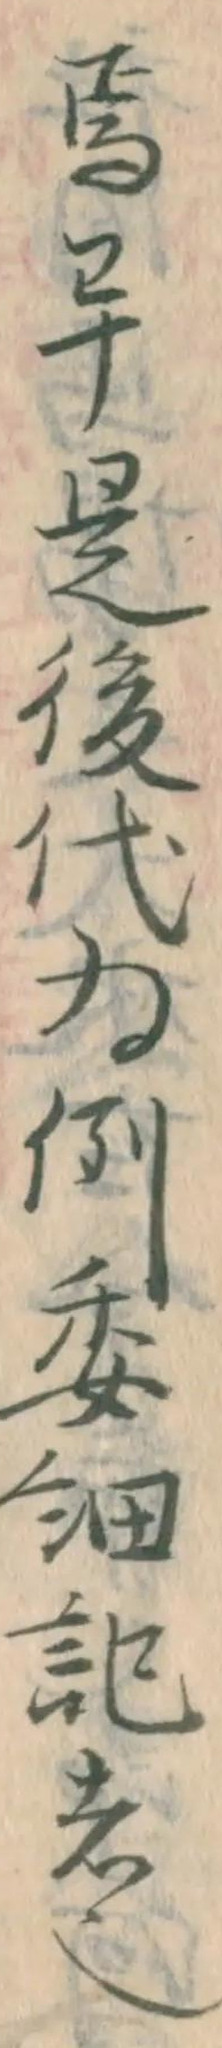焉畢是後代為例委細記者也
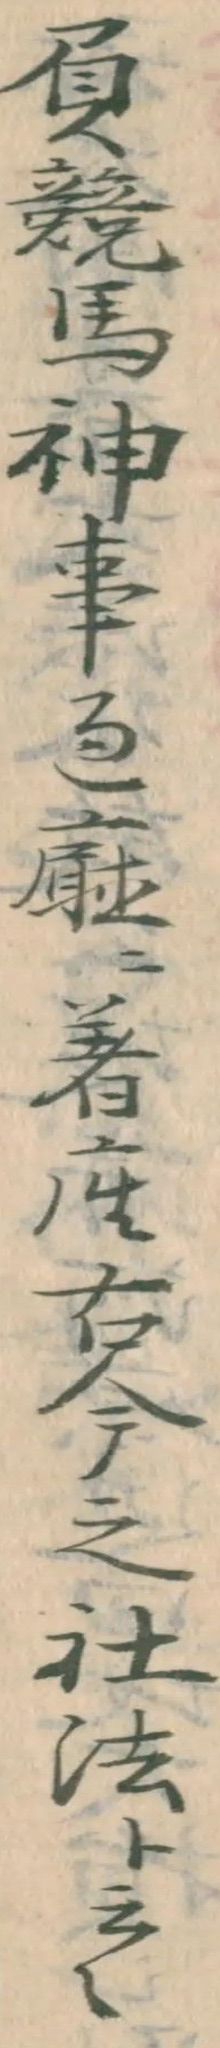負競馬神事過庁ニ着座古今之社法ト云々
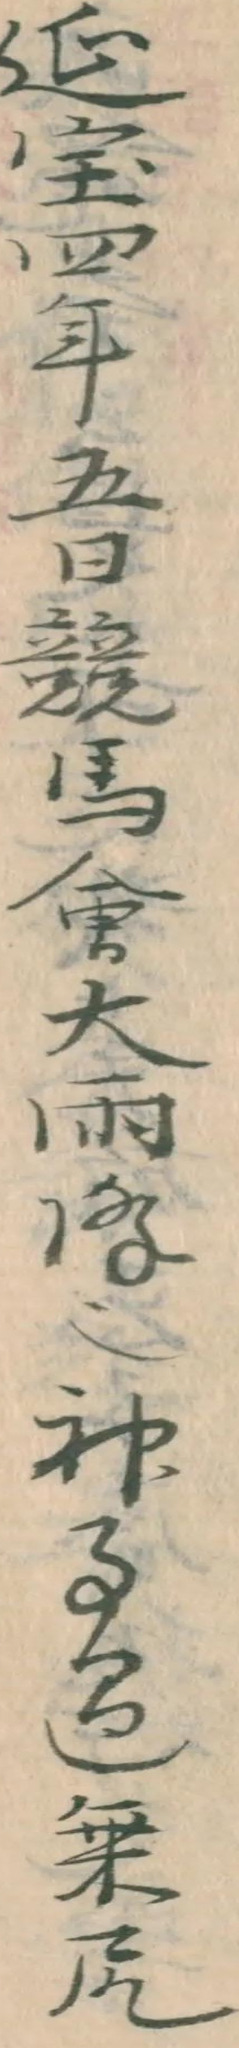延宝四年五日競馬会大雨降也神事過乗尻
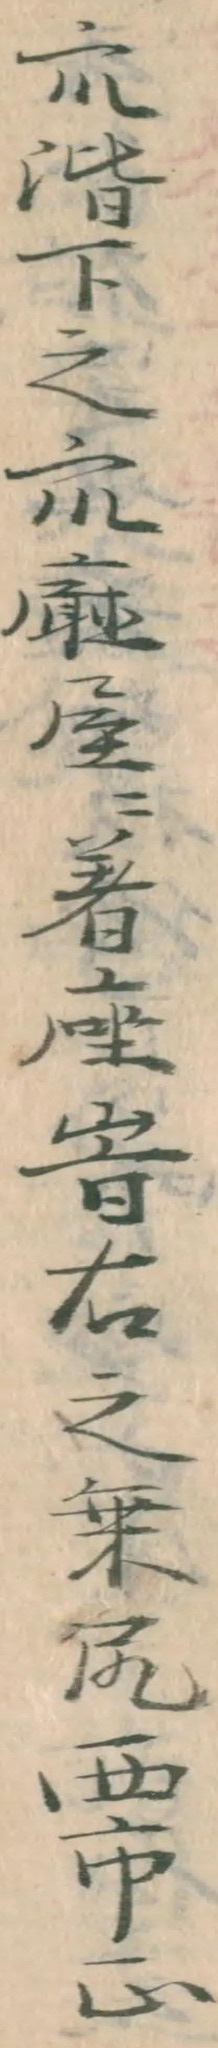衆階下之衆庁屋ニ着座旹右之乗尻西市正
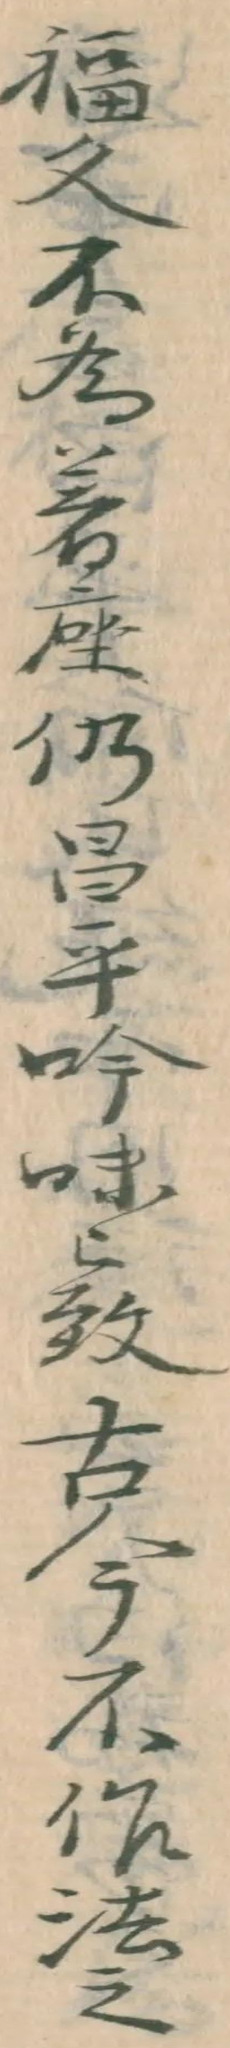福久不為着座仍昌平吟味被致古今不作法之
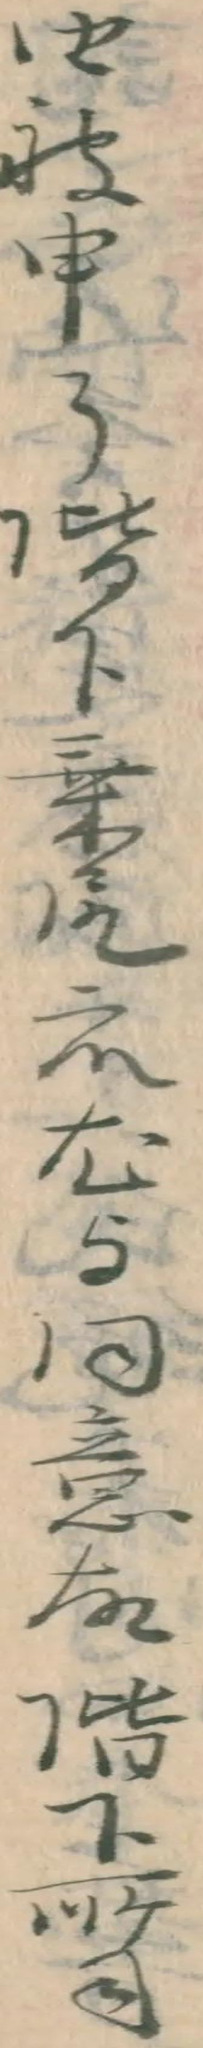由被申了階下乗尻衆尤与同意故階下所司
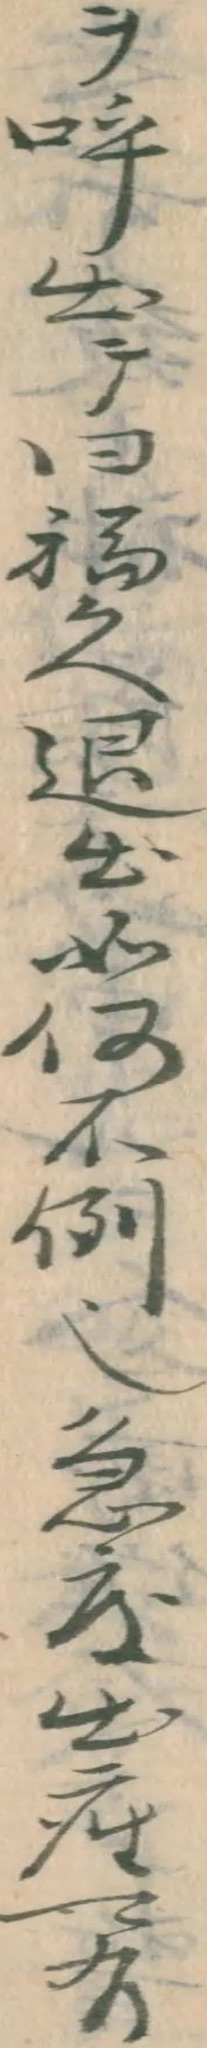ヲ呼出テ曰福久退出如何不例也急度出座可有
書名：賀茂社記録. 第10冊
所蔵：国立国会図書館 National Diet Library, JAPAN
